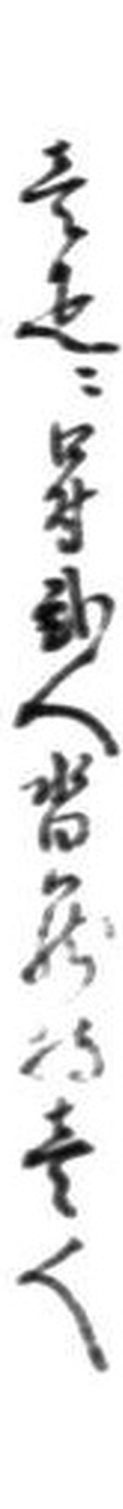壱疋ニ口付弐人沓籠持壱人
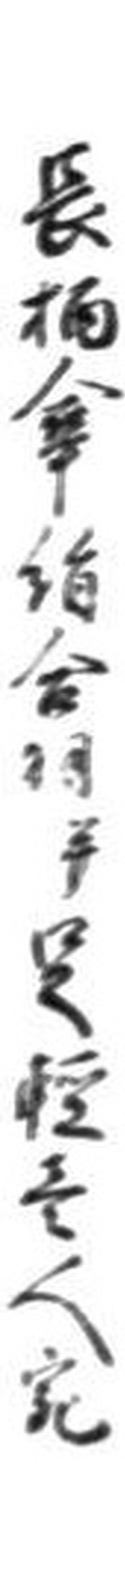長柄傘絹合羽并足軽壱人宛
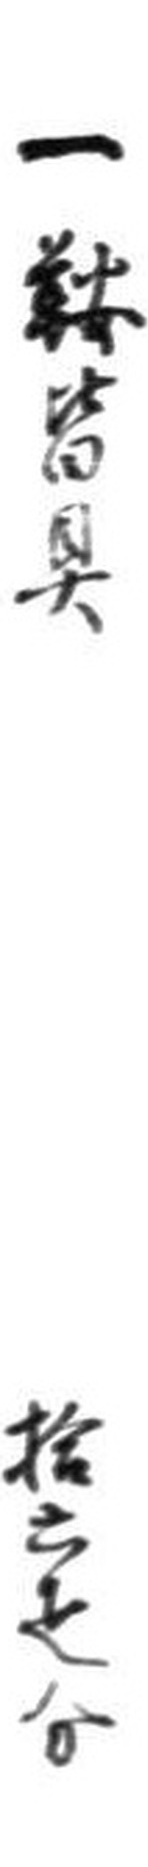一鞍替具拾六疋分
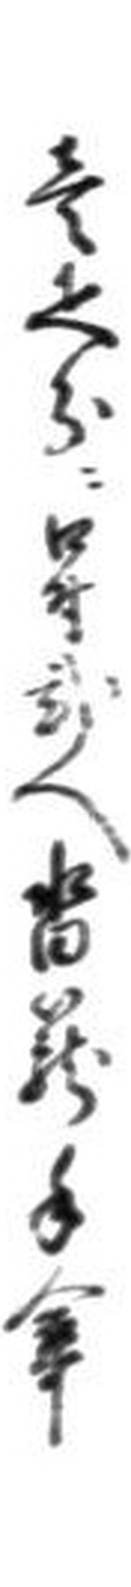壱疋分ニ口付弐人沓籠手傘
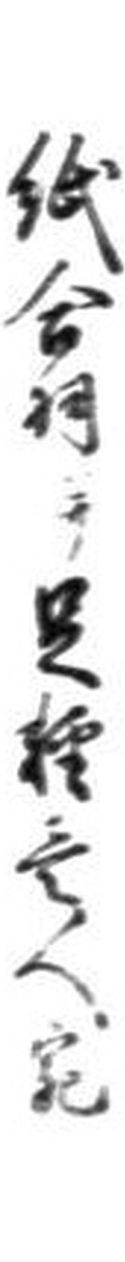紙合羽并足軽壱人宛
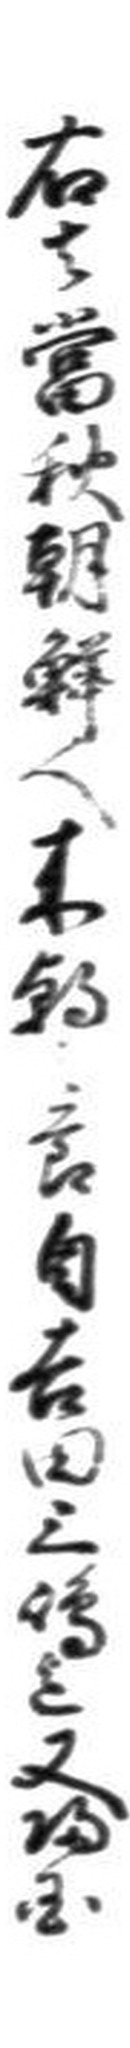右者当秋朝鮮人来朝之節自吉田三島迄又帰国

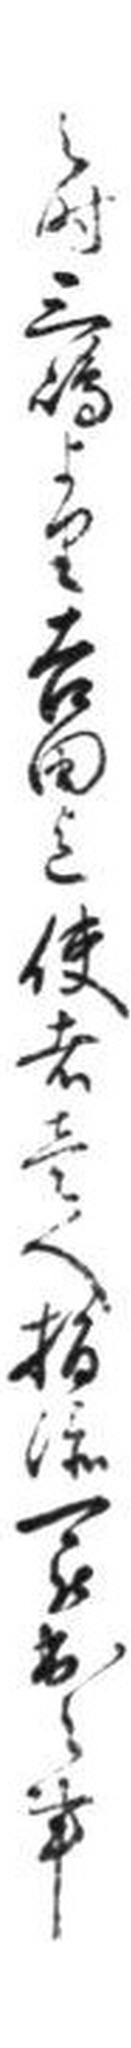之時三嶋より吉田迄使者壱人指添可被出之事
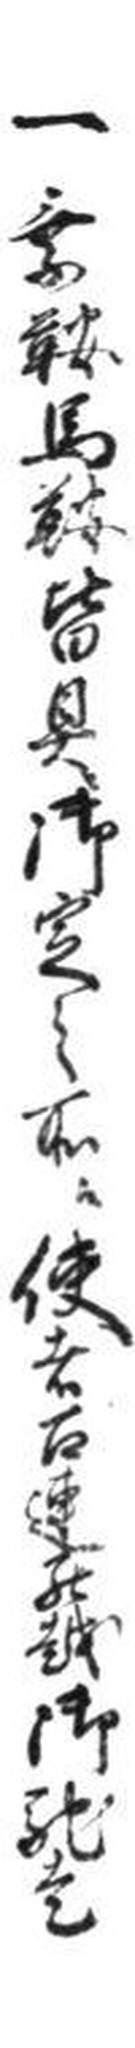一乗鞍馬鞍皆具御定之所江使者召連罷越御馳走
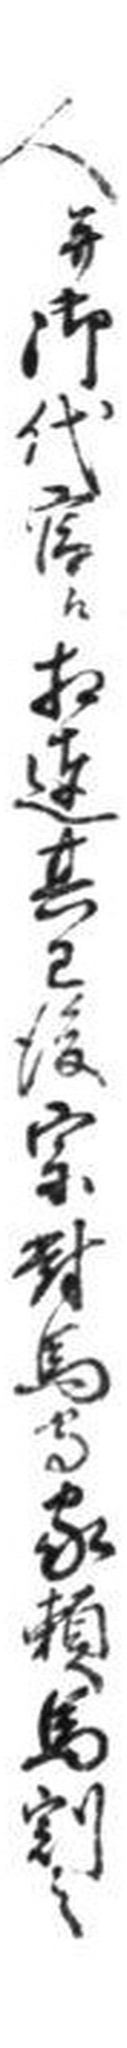人并御代官江相達其已後宗対馬守家頼馬割之
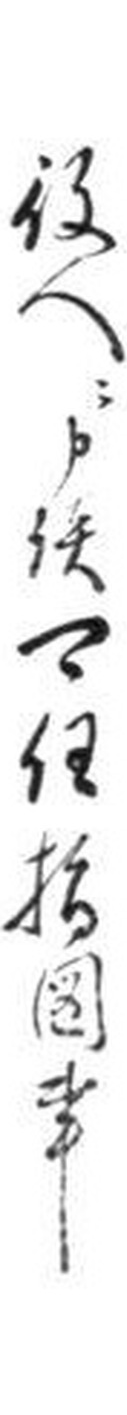役人ニ申談可任指図事
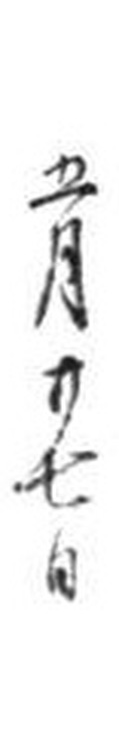五月廿七日
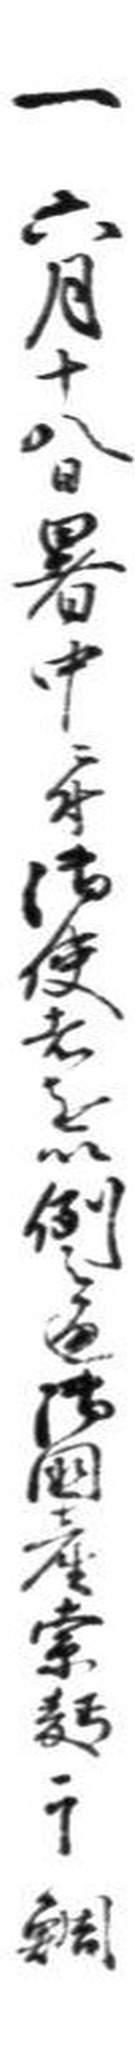一六月十八日暑中ニ付御使者を以例之通御国産索麪干鯛
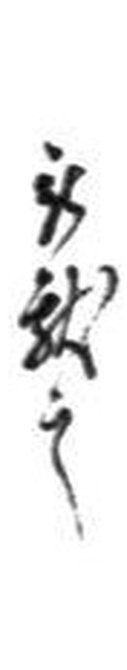被献之
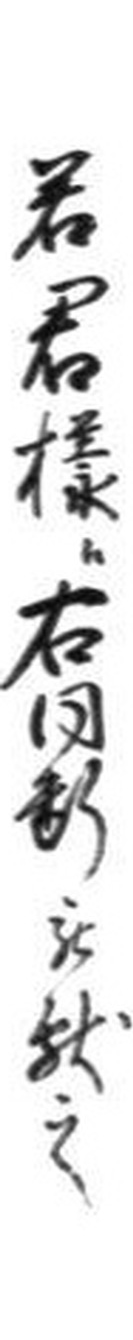若君様江右同断被献之
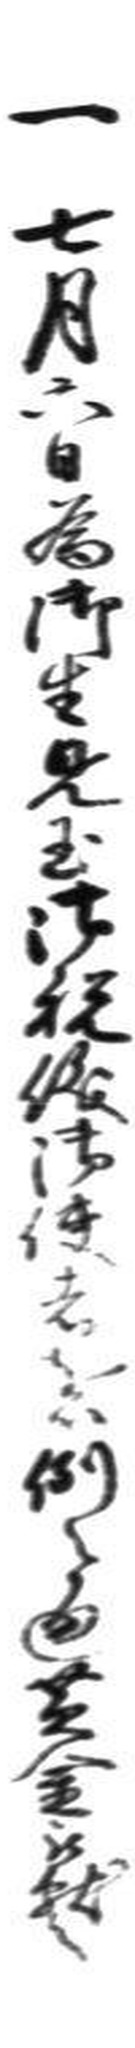一七月六日為御生見玉御祝儀御使者を以例之通黄金被献之
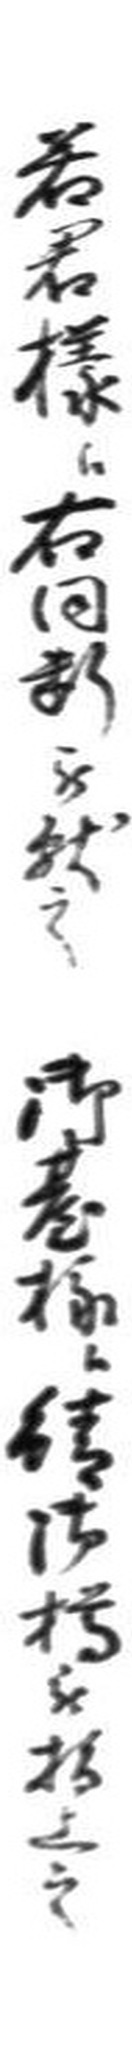若君様江右同断被献之御台様江鯖御樽被指上之
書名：家譜 十五 綱昌公 従天和元年到元禄十二年
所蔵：福井県文書館 Fukui Prefectural Archives
